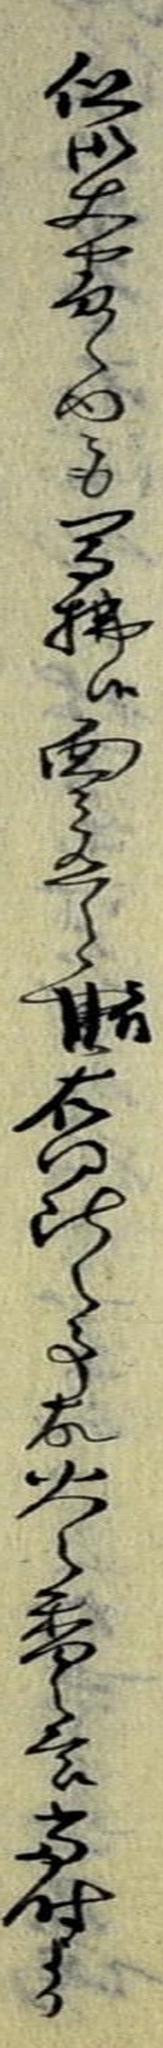但御使番之内にも馬払候面々有之に付右同断之事故火之番之節当時より
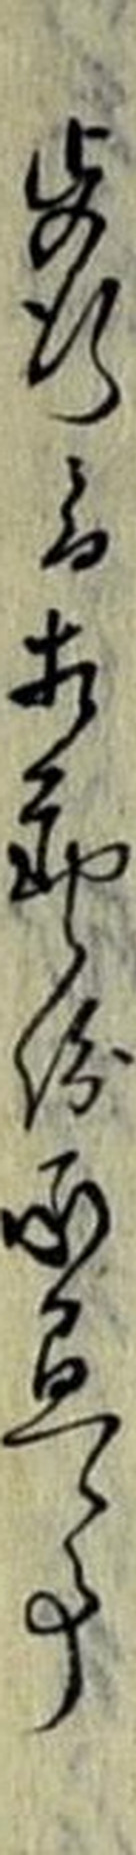歩行に而相勤候儀承置候事
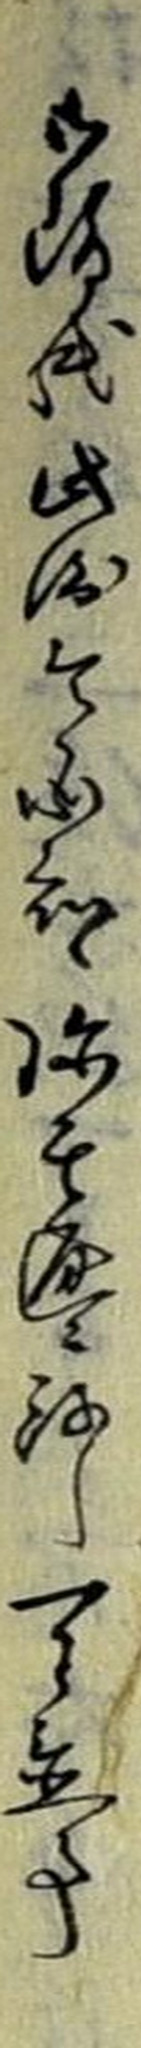御附紙此儀令承知候弥其通に致し可被置事
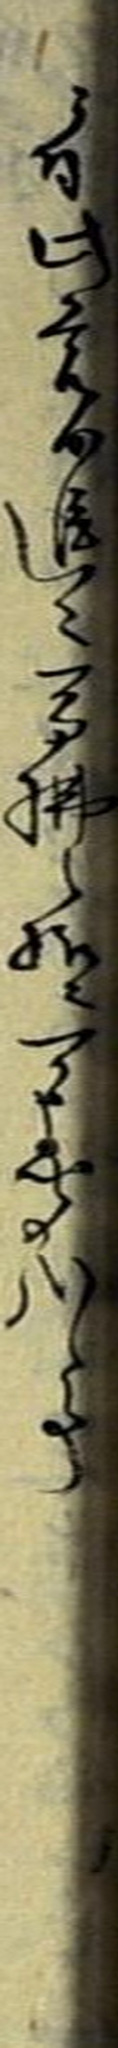に付此節ゟ追々馬払之様に可申聞哉之事
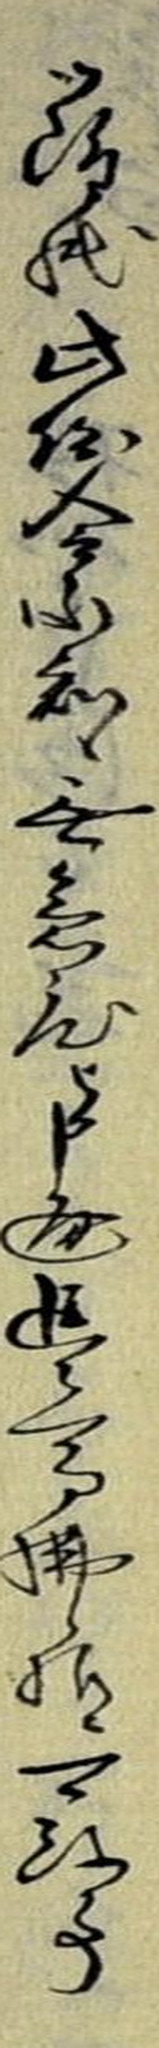御附紙此儀令承知候無急度被申通追々馬払候様に可致事
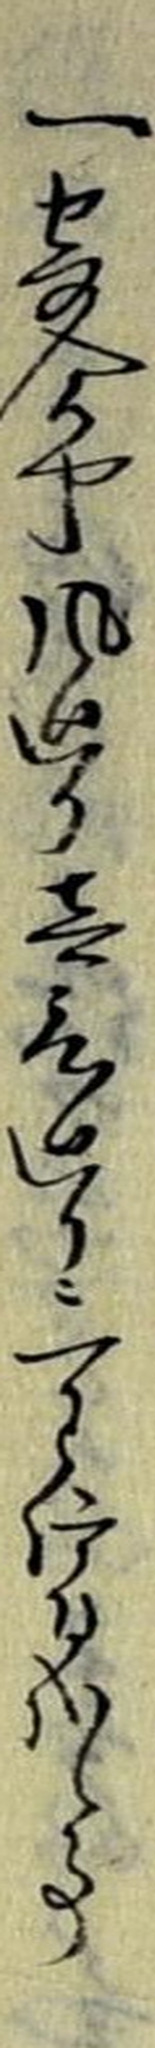一寄合中風廻り壱度廻りに可被仰付哉之事
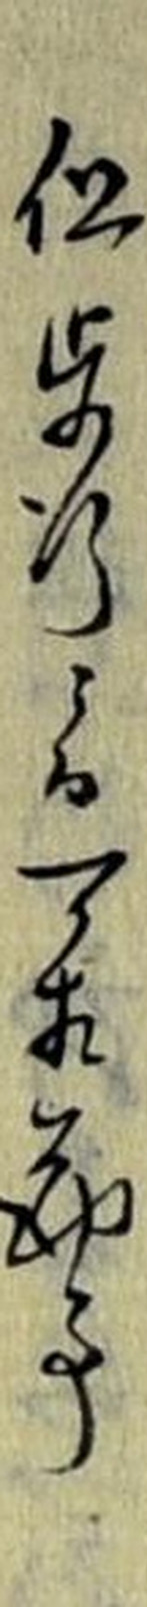但歩行に而可相勤事
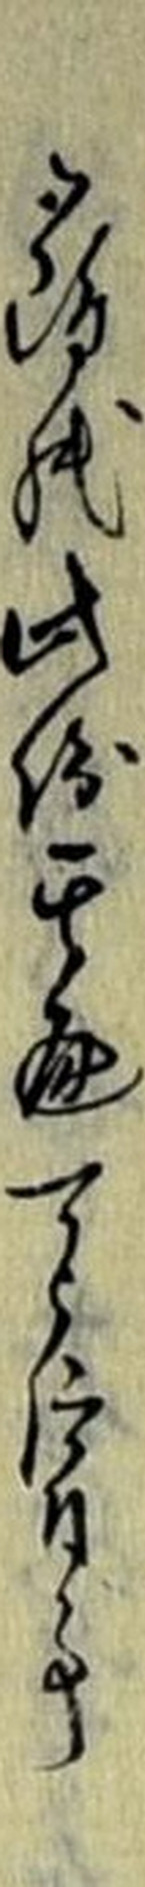御附紙此儀其通可被仰付事
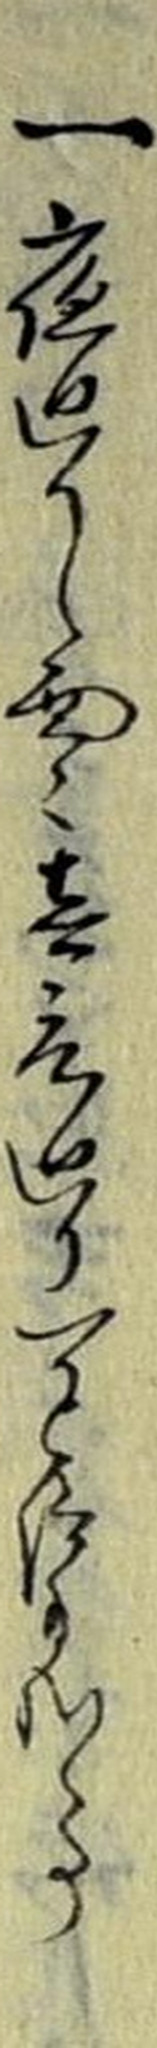一夜廻り之面々壱度廻り可被仰付哉之事
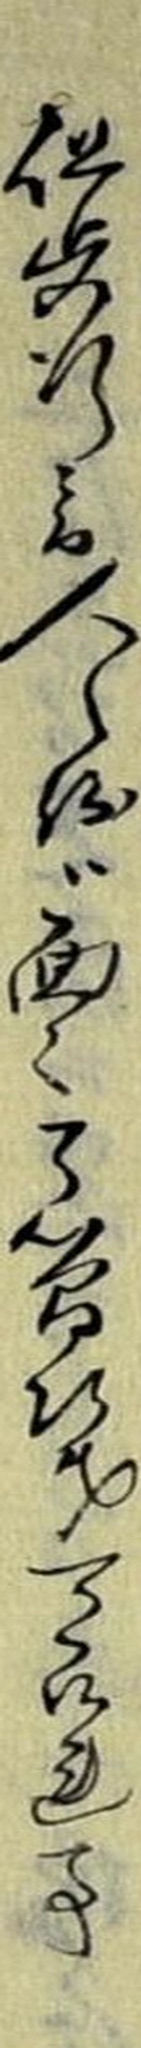但歩行に而人之儀は面々了簡次第可召連事
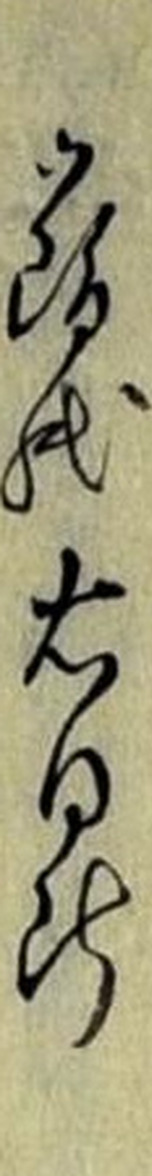御附紙右同断
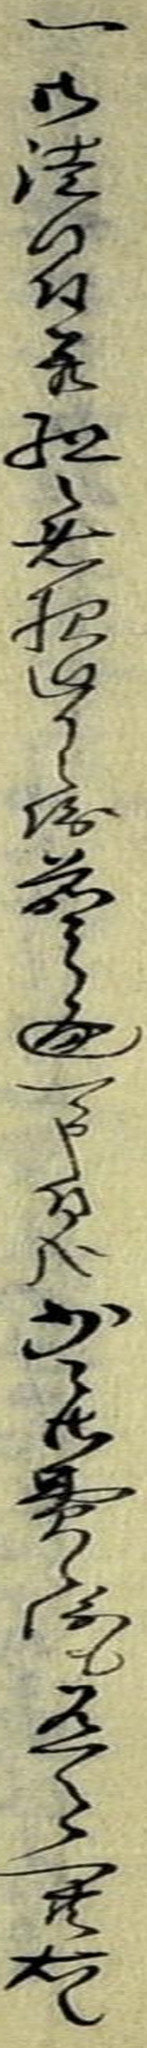一御徒目付并組之者夜廻り之儀前々之通可申付哉少々御費之儀も有之候へ共右之
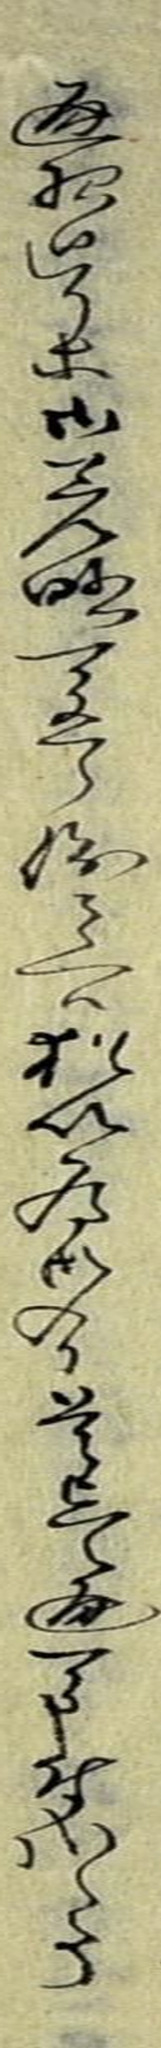通夜廻り等御差略可有之儀に候へは猶以為御〆り是迄之通可申付哉之事
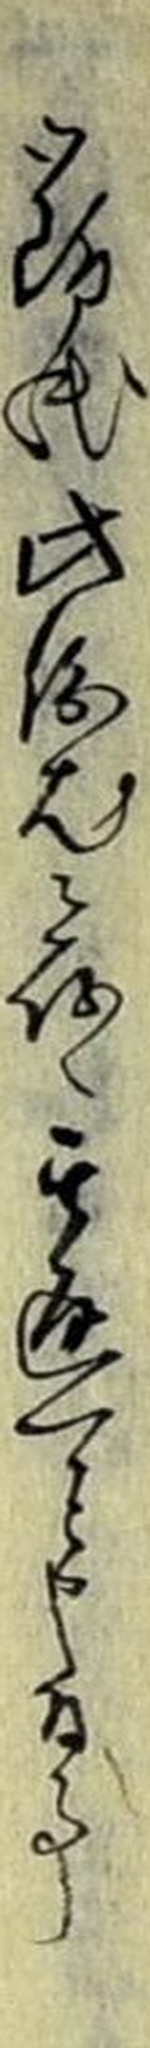御附紙此儀尤に存候其通可被申付事
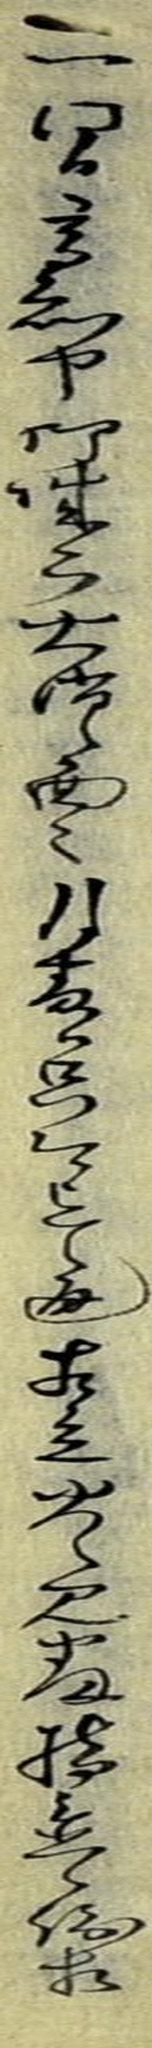一同日高知中御城下火消之面々月番は只今迄之通相立火之見番指置候儀相
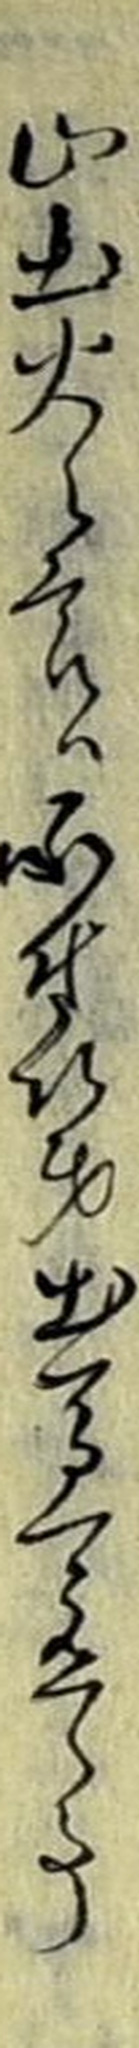止出火之節は承付次第出馬可有之事
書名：命令之部 二
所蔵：福井県文書館 Fukui Prefectural Archives
